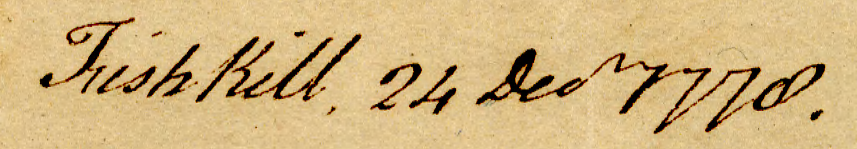FishKill 24 Dec^r 1778.
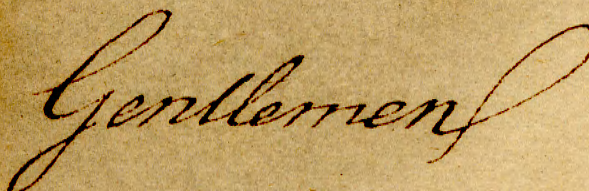Gentlemen
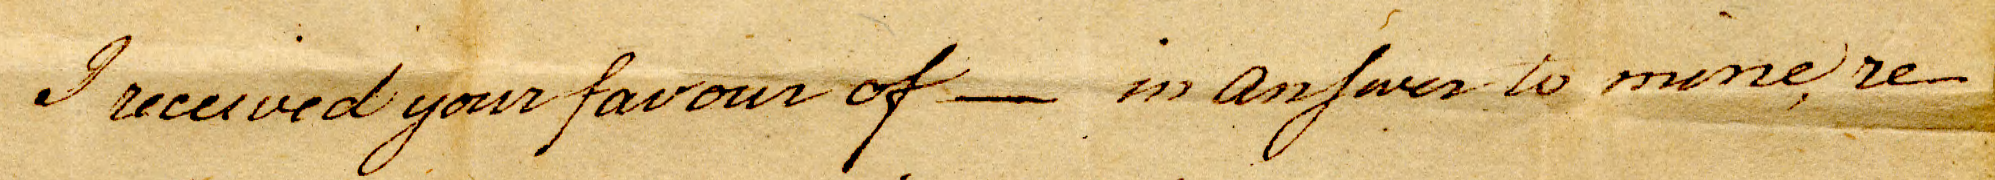I received your favour of- in answer to mine, re-
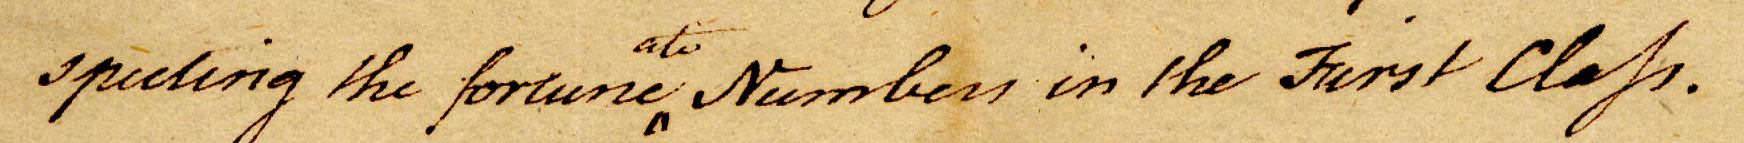specting the fortune^ate Numbers in the First Class.
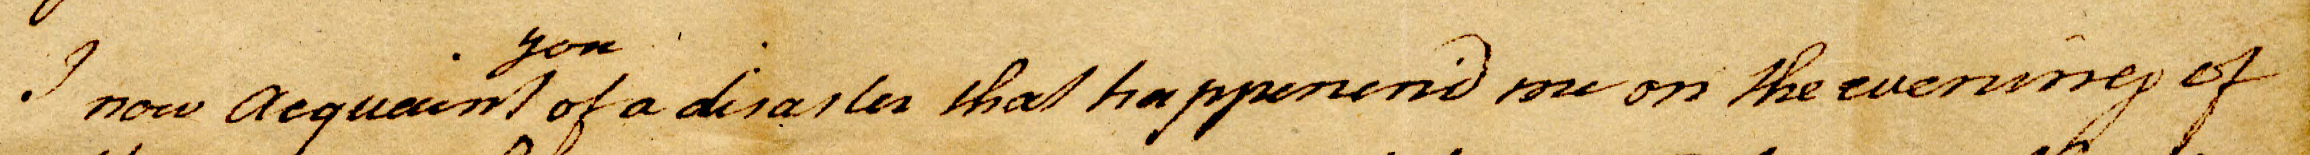I now acquaint ^ of a disaster that happened me on the evening of
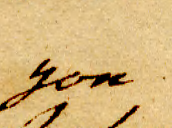you
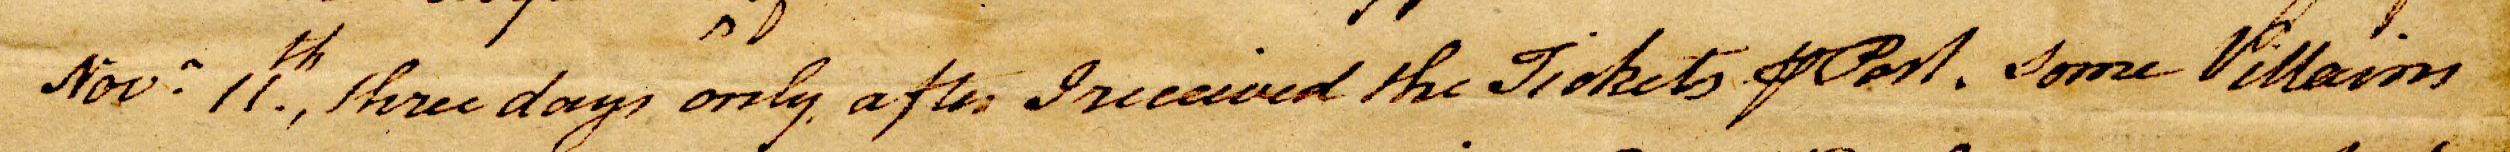Nov^r. 11.^th, three days only after I received the Tickets per Parl. some Villains
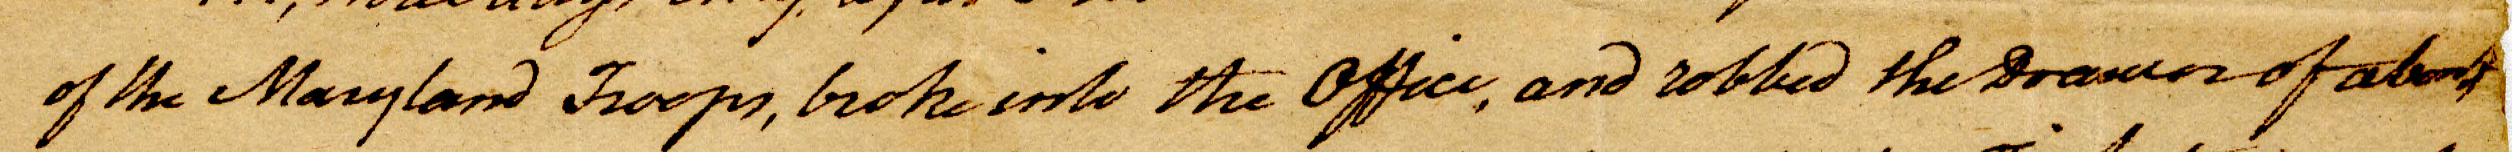of the Maryland Troops, broke into the Office, and robbed the Drawer of about
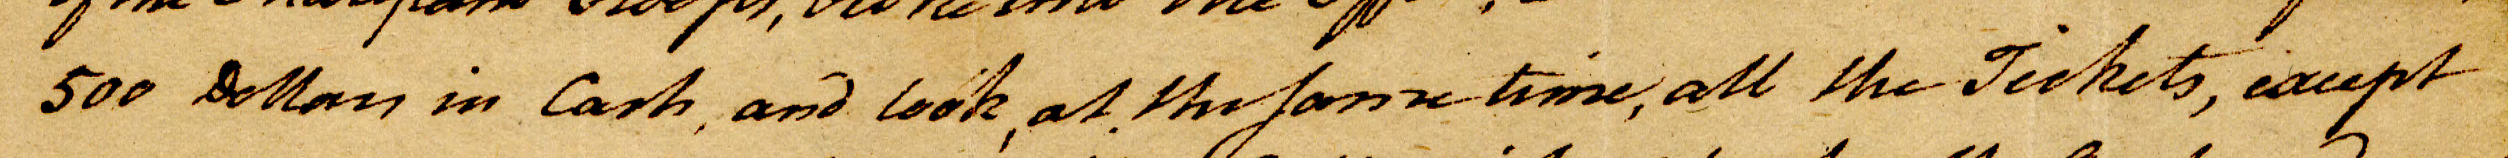500 dollars in cash and took, at the same time, all the Tickets, except
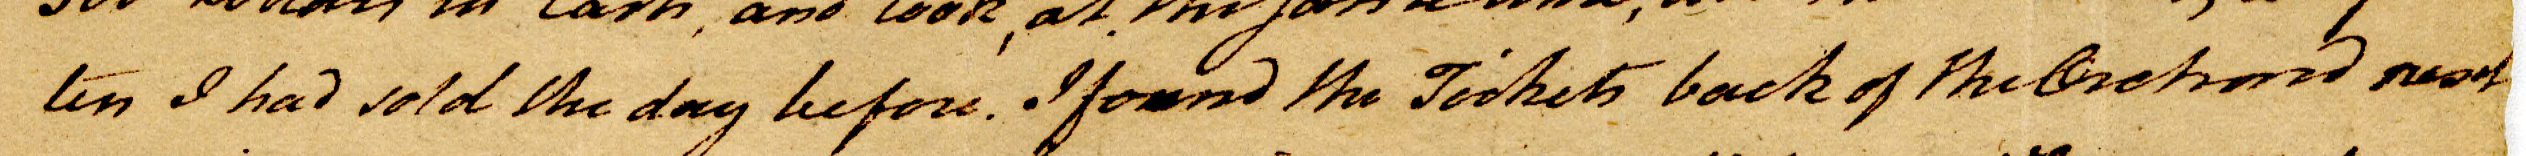ten I had sold the day before. I found the Tickets back of the Orchard next
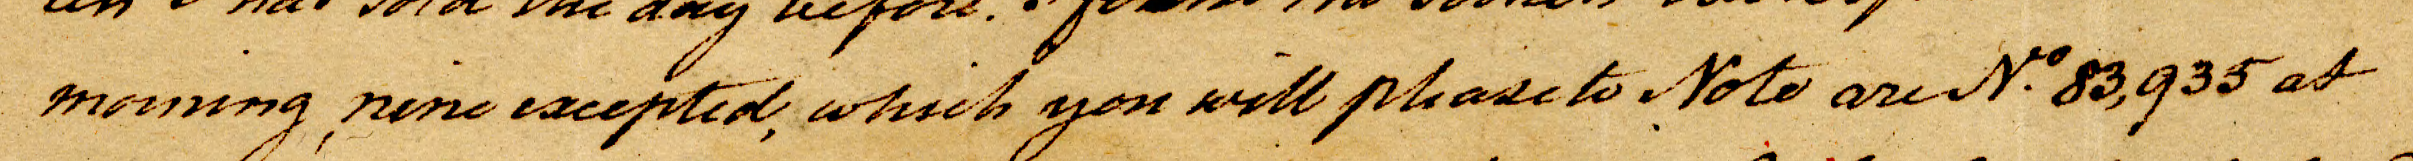morning, nine excepted, which you will please to Note are N^o. 83,935 at
